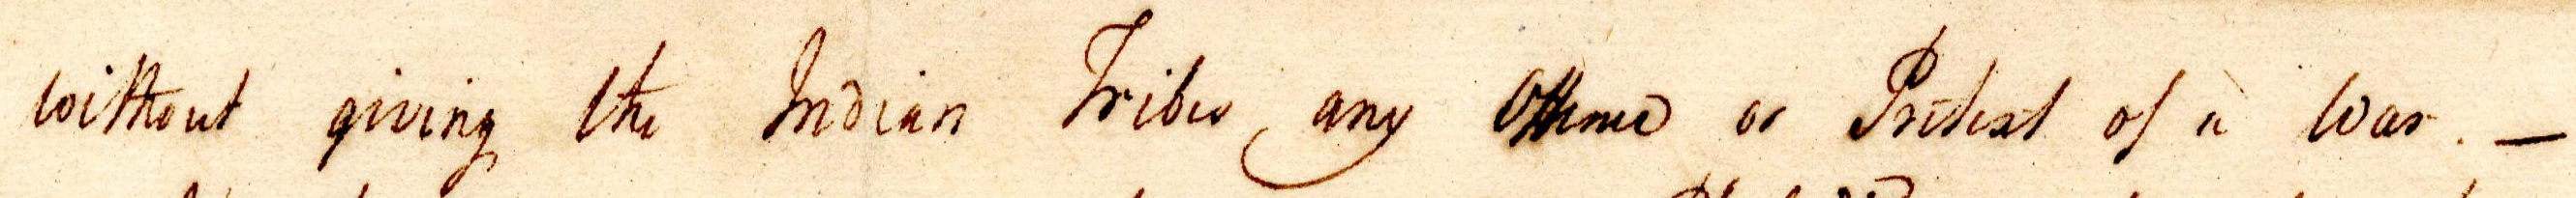without giving the Indian Tribes any Offense or Pretext of a War.-
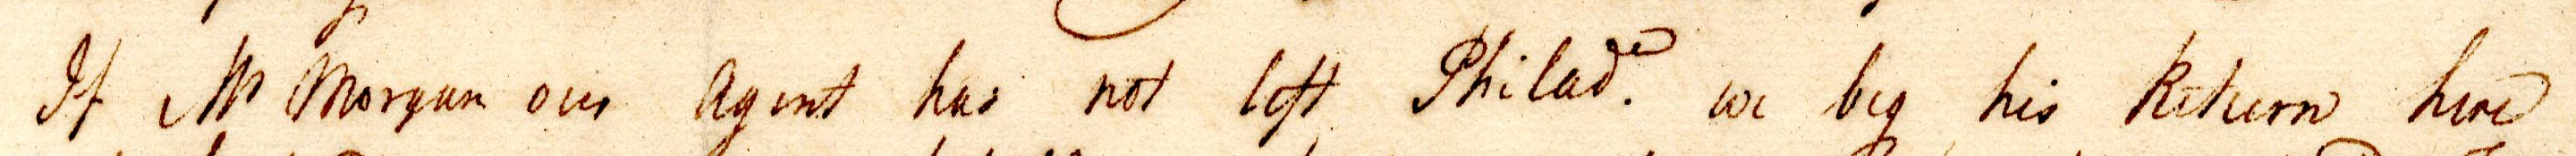If M^r Morgan our Agent has not left Philad^a we beg his Return here
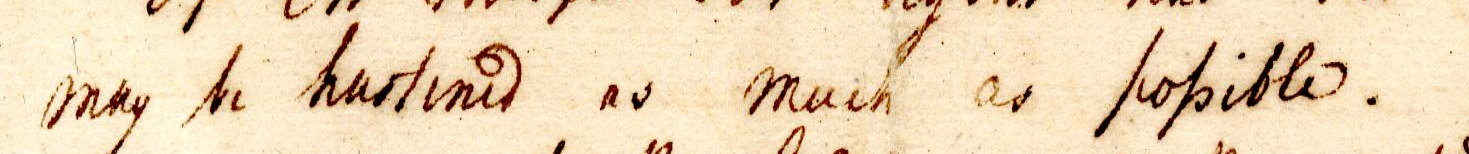may be hastened as much as possible.
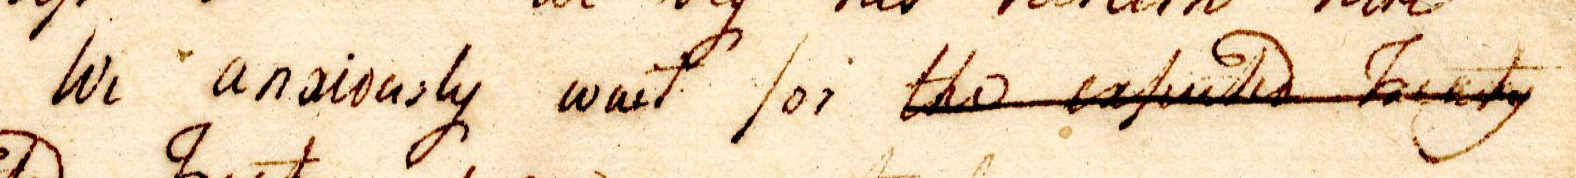We anxiously wait for [the expected Treaty]
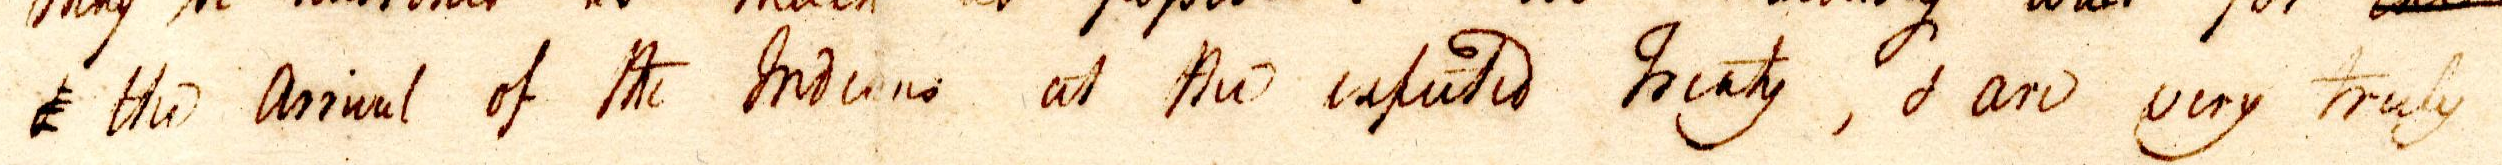& the Arrival of the Indians at the expected Treaty, & are very truly
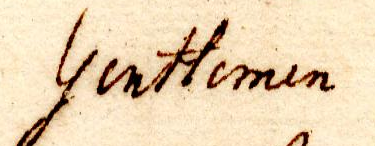Gentlemen
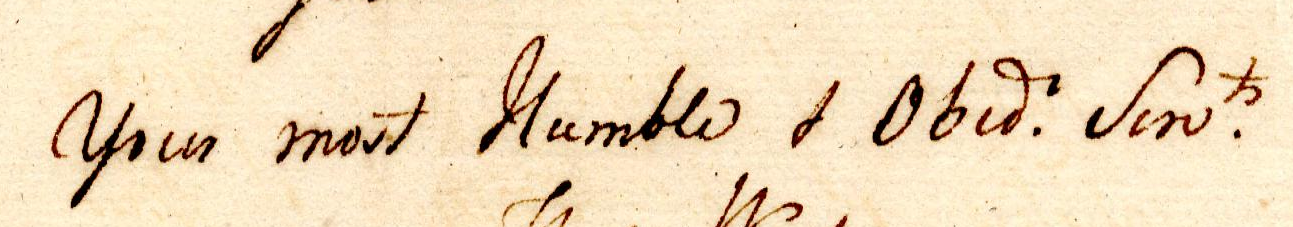Your most Humble & Obed^t Serv^t.
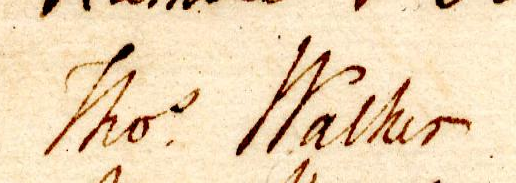Tho^s. Walker
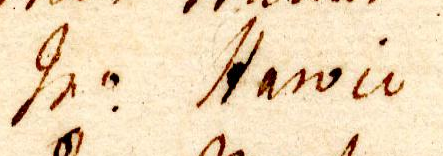Jn^o. Harvie
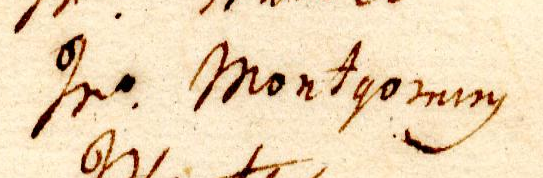Jn^o. Montgomery
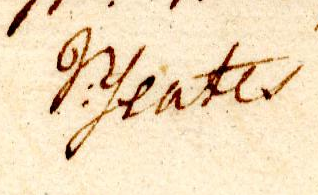J. Yeates
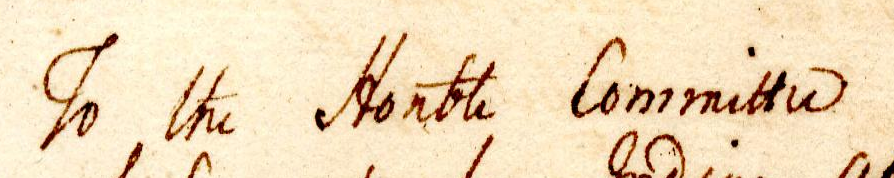To the Honble Committee
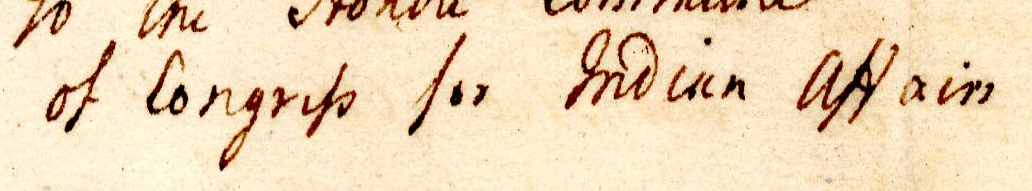of Congress for Indian Affairs
